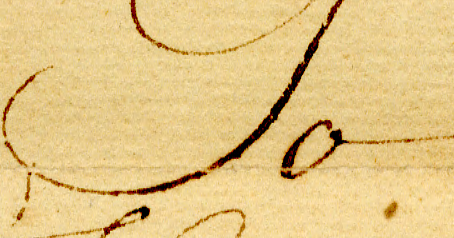To
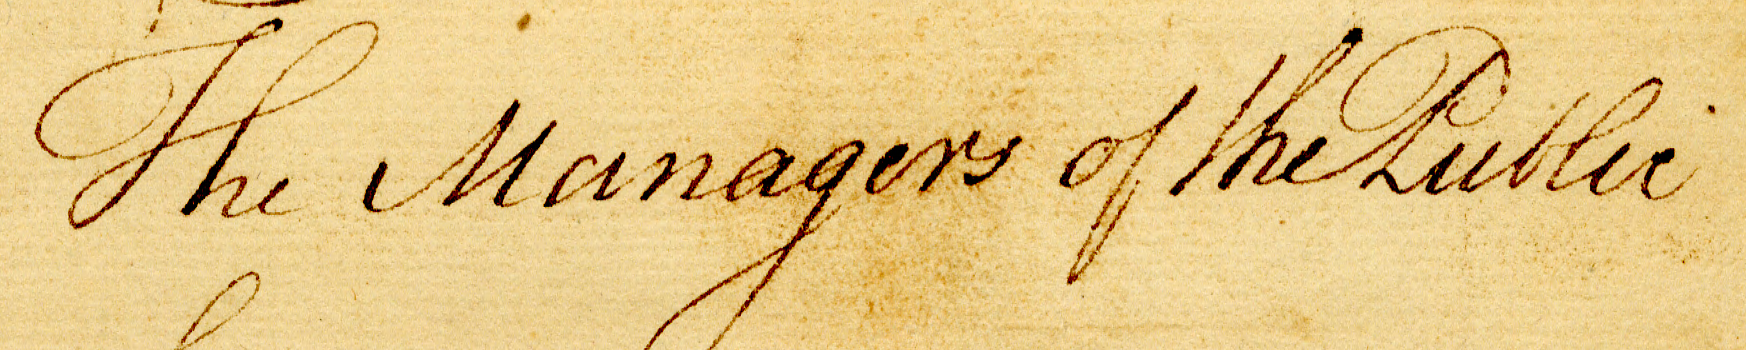The Mangers of the Public
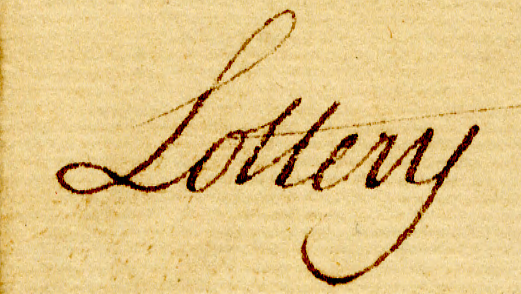Lottery
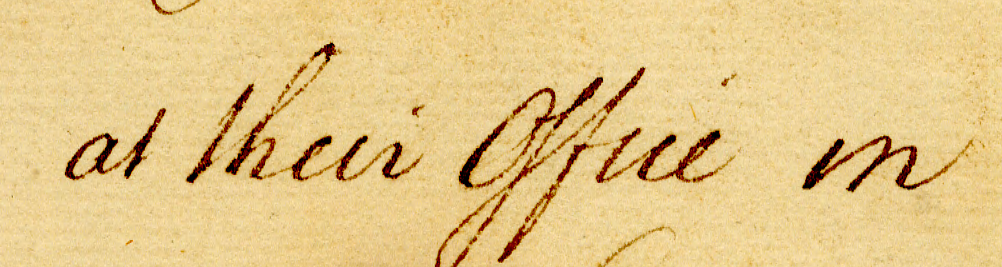at their Office in
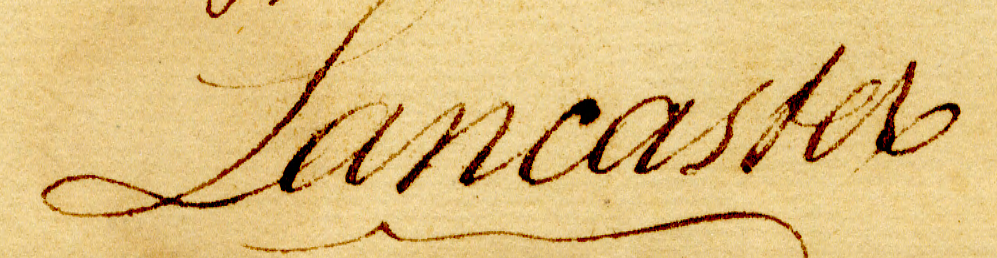Lancaster
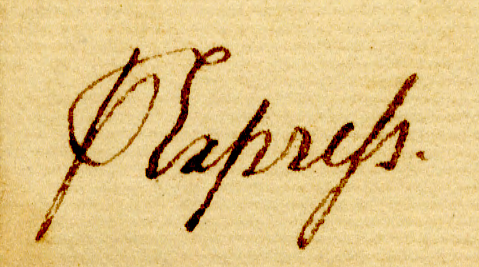P Express
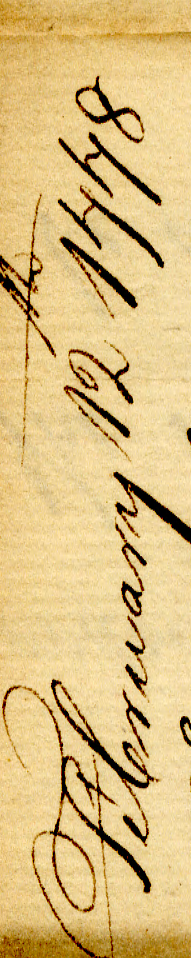February 12^th 1778
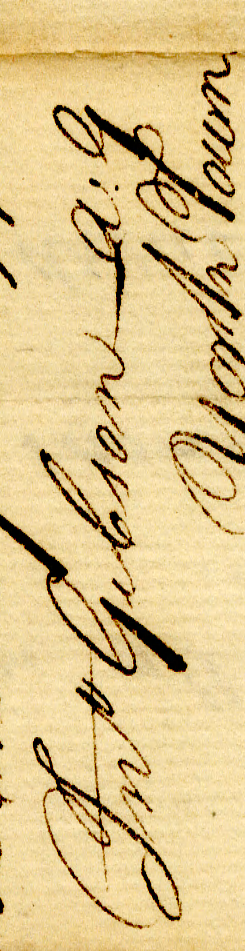Jn^o Gibson-A.G
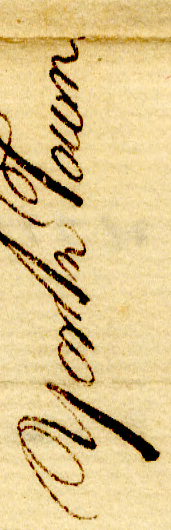York Town
